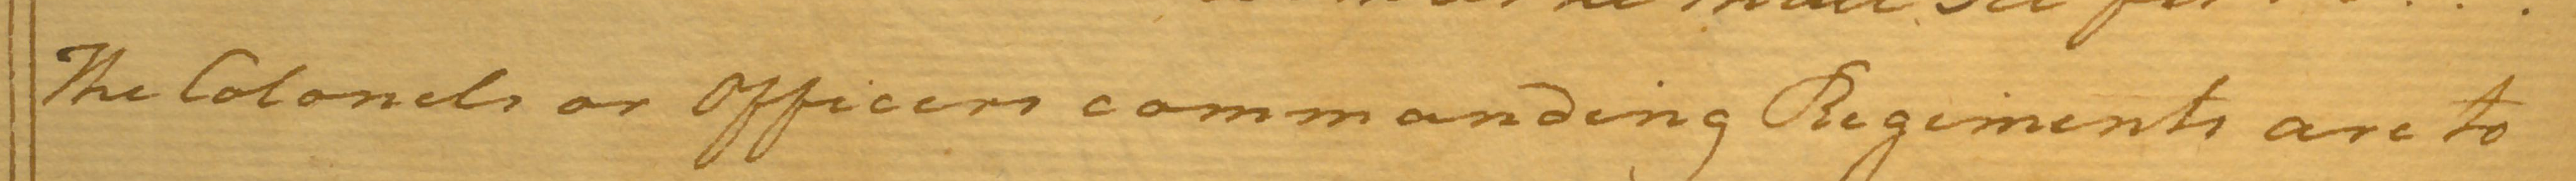The Colonels or Officers commanding Regiments are to
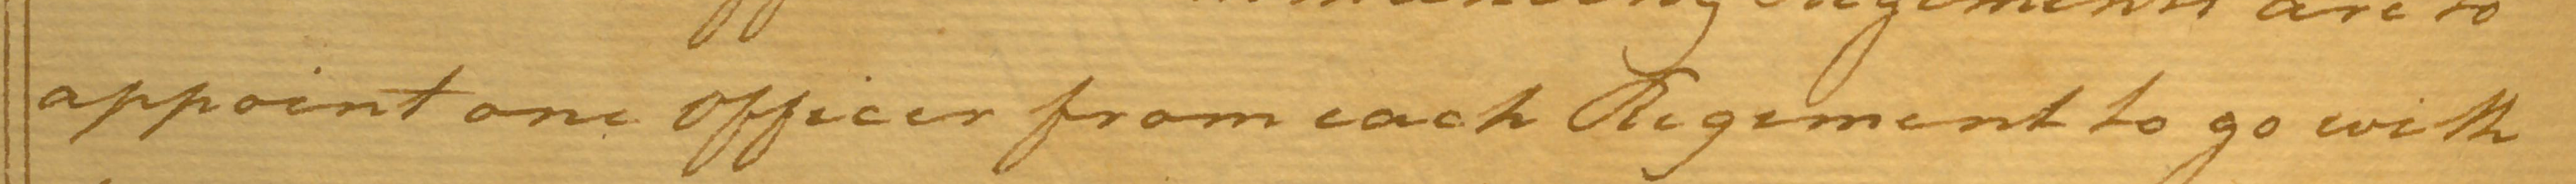appoint one Officer from each Regiment to go with
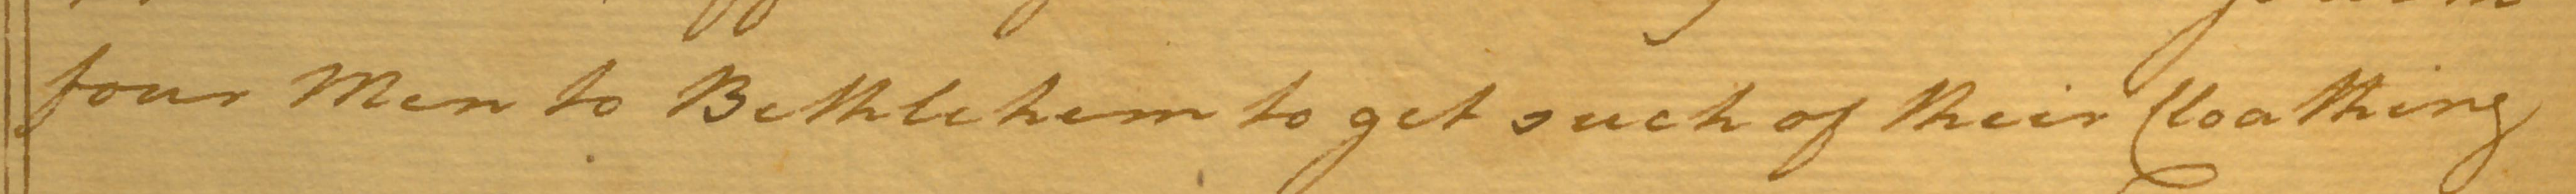four Men to Bethlehem to get such of their Cloathing
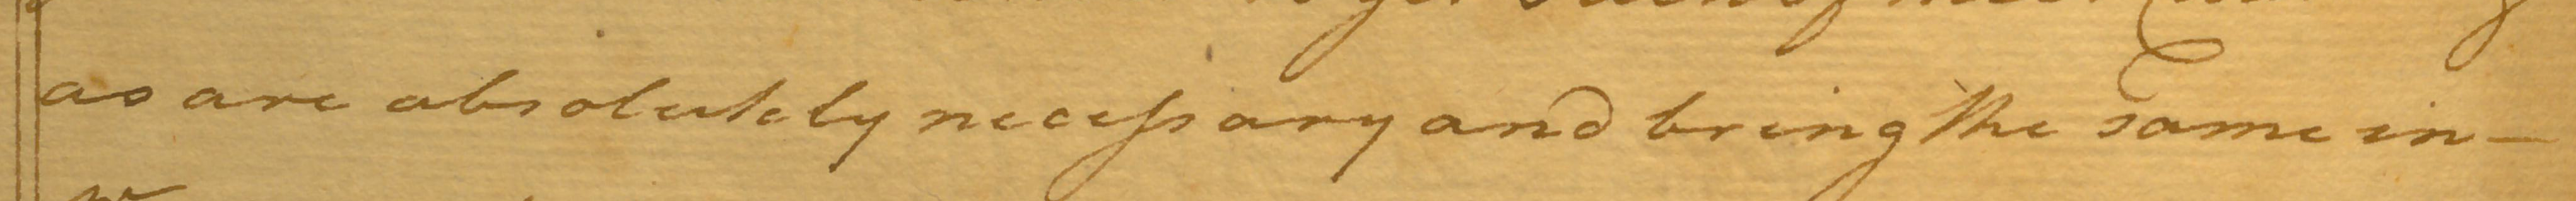as are absolutely necessary and bring the same in-
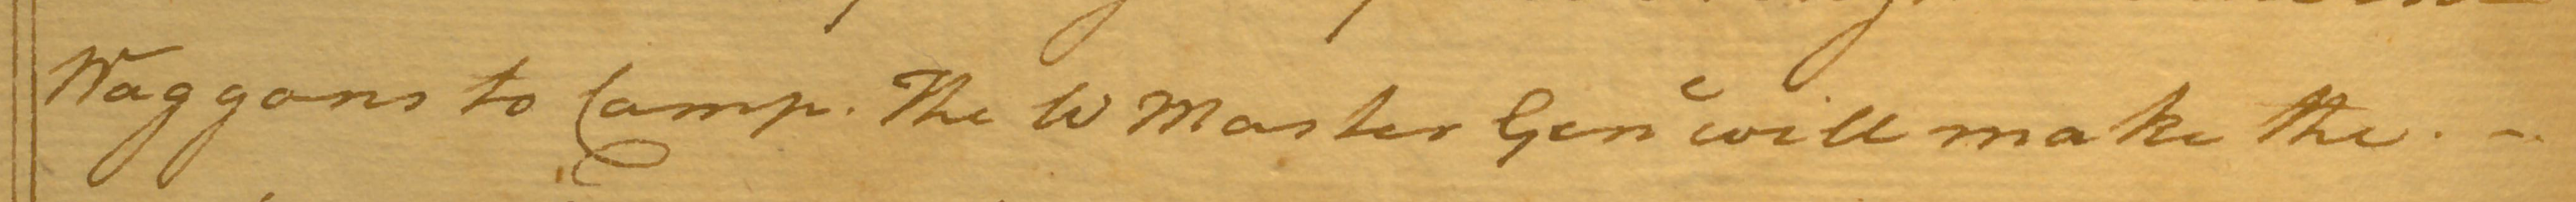Waggons to Camp. The Q Master Gen^l will make the-
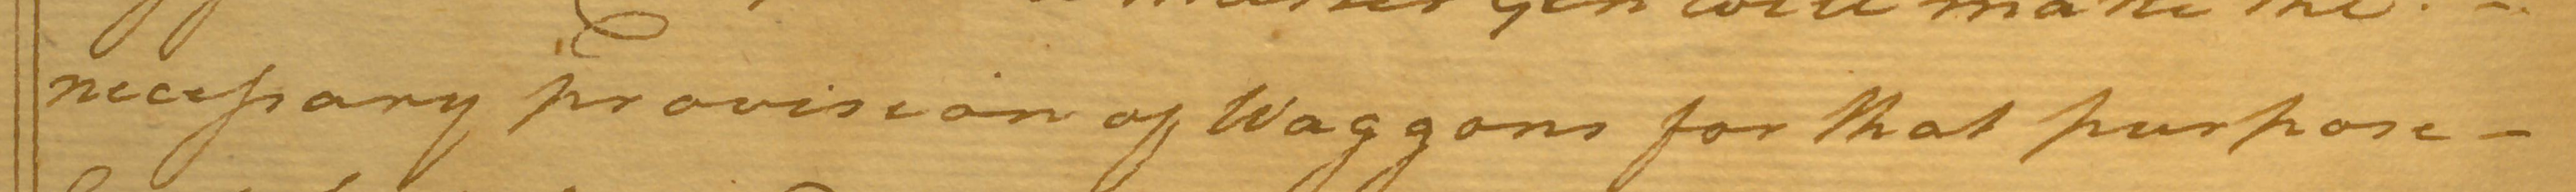necessary provisions of Waggons for that purpose-
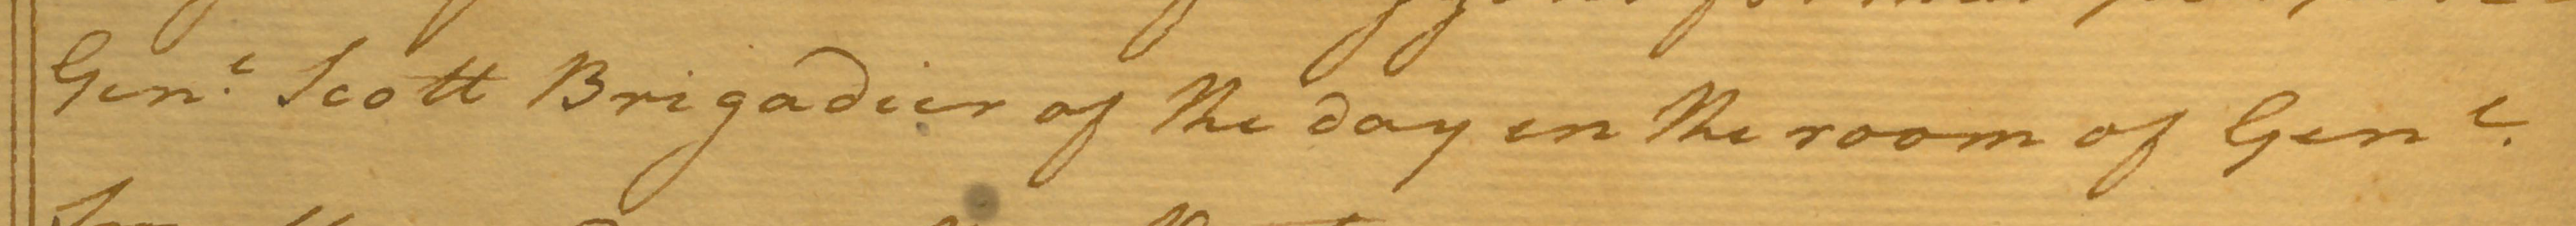Gen^l. Scott Brigadier of the day in the room of Gen^l.
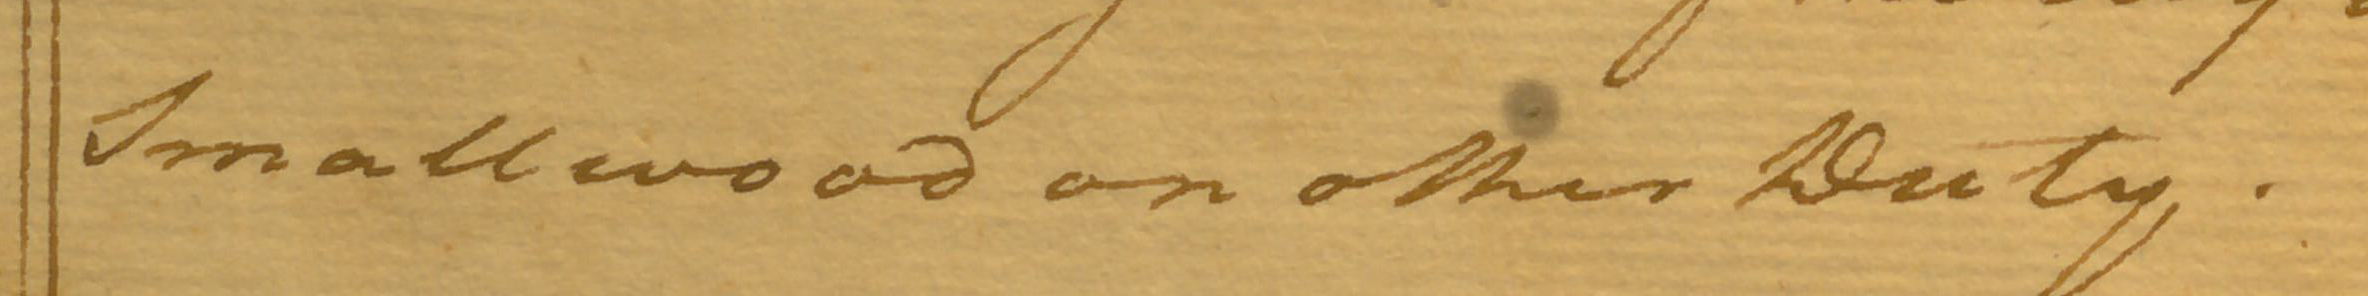Smallwood on other Duty.
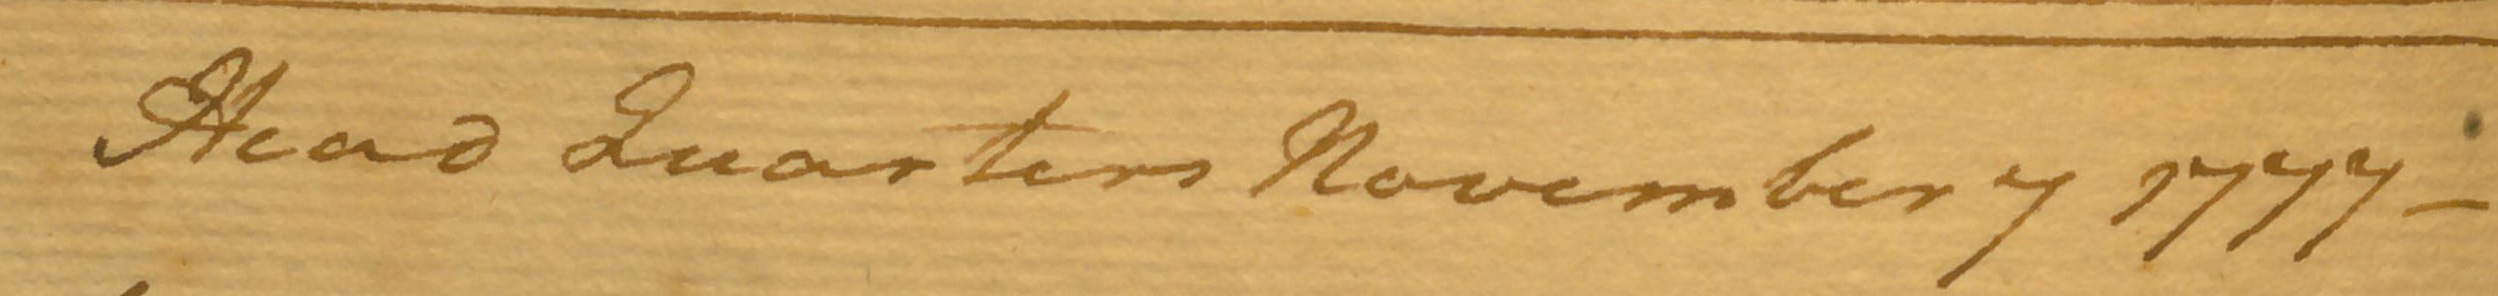Head Quarters November 7 1777-
